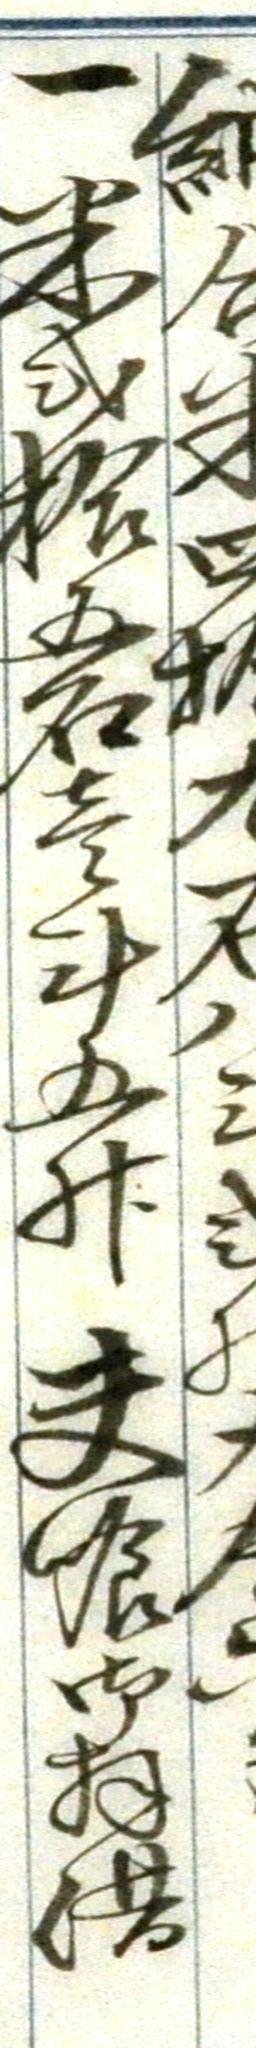一米弐拾五石壱斗五升夫喰御拝借
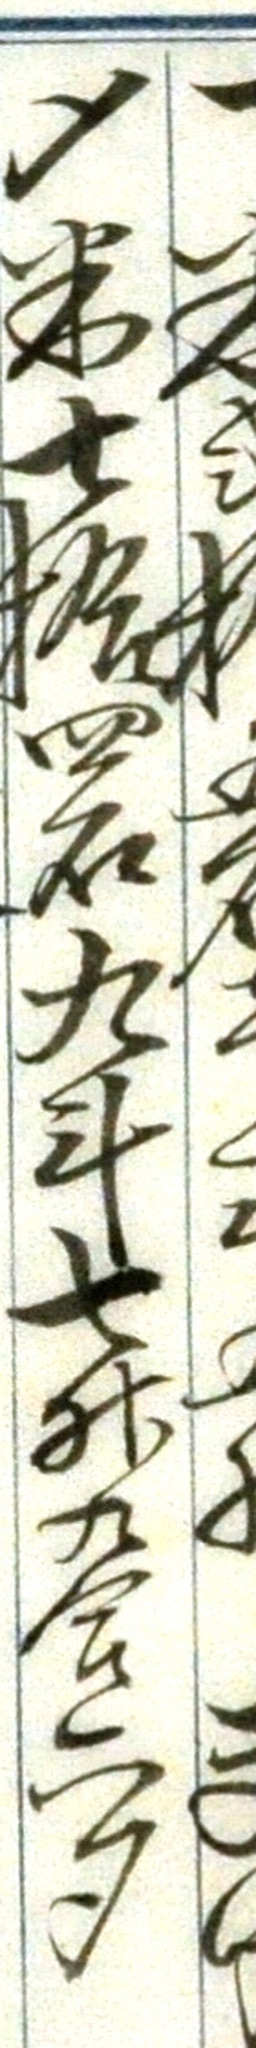〆米七拾四石九斗七升九合六勺
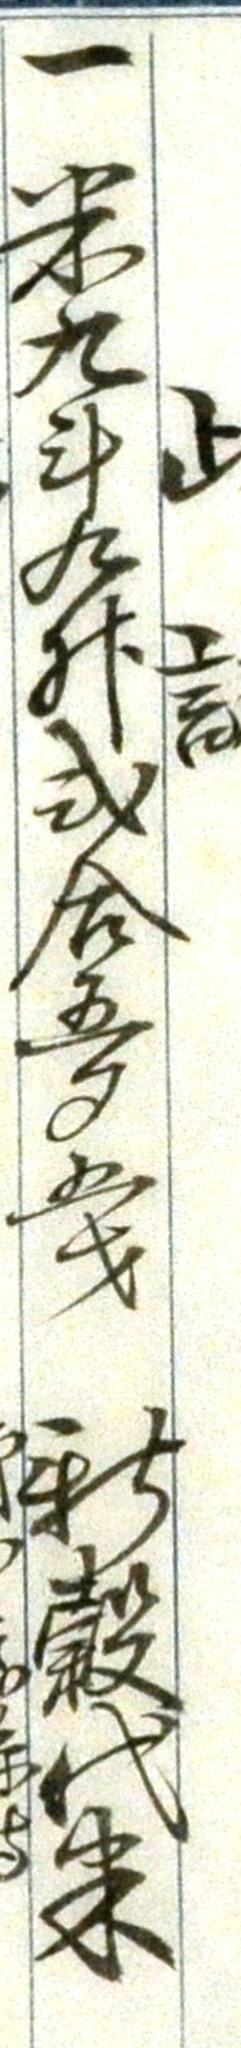一米九斗九升弐合五勺五才新穀代米
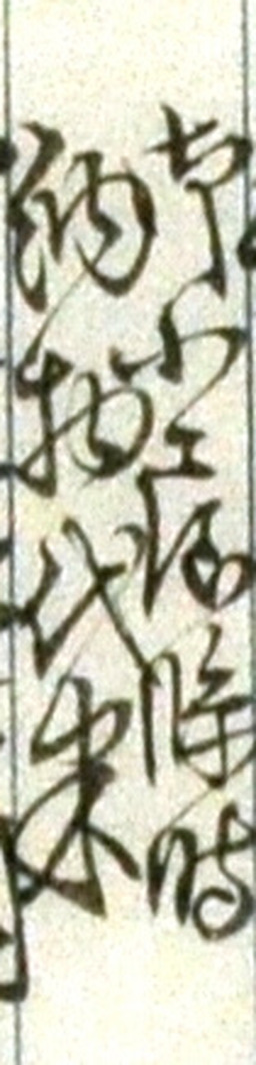納物代米
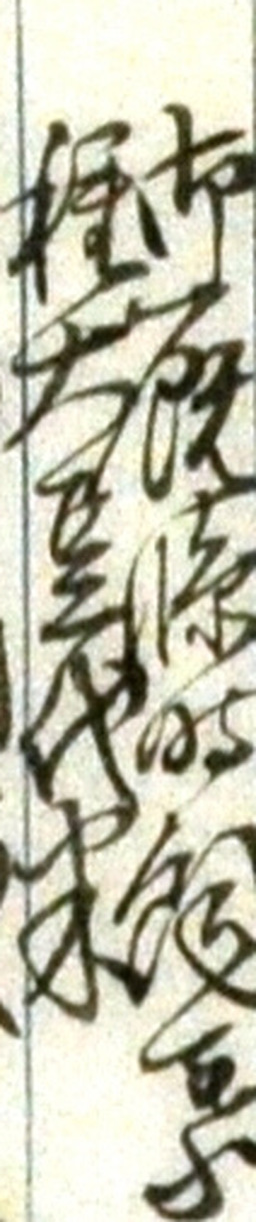種大豆代米
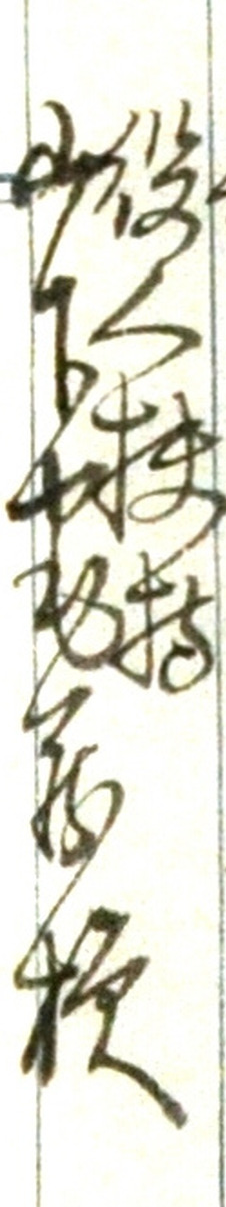山下宅蔵様

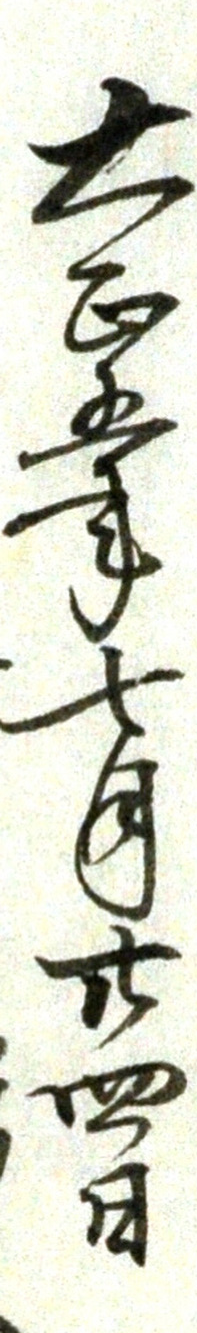大正五年十月廿四日
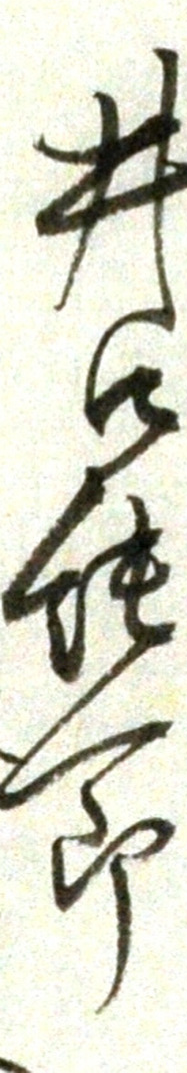井口純一郎
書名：御蔵〆目録・御年貢御上納目録
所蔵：伊那市立高遠町図書館・合同会社AMANE
